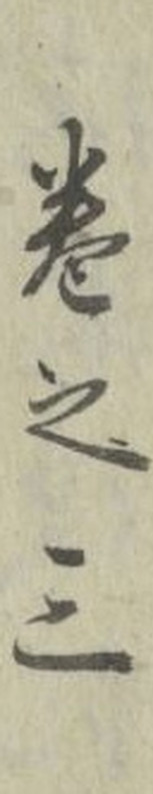巻之三
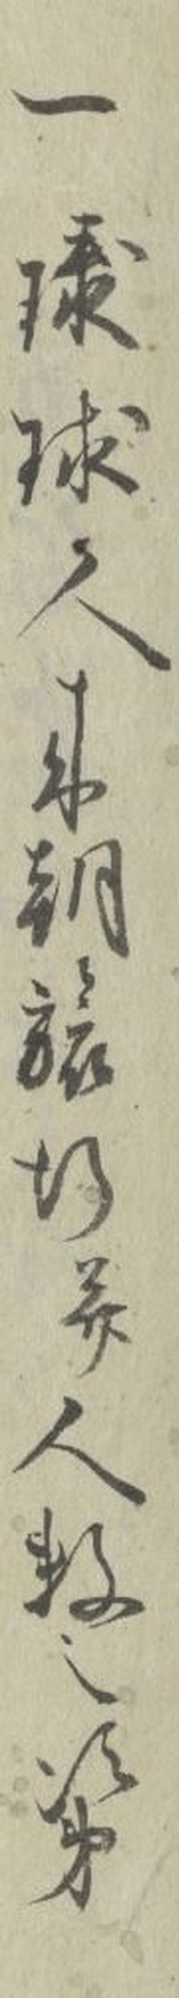一琉球人来朝旅行幷人数之次第
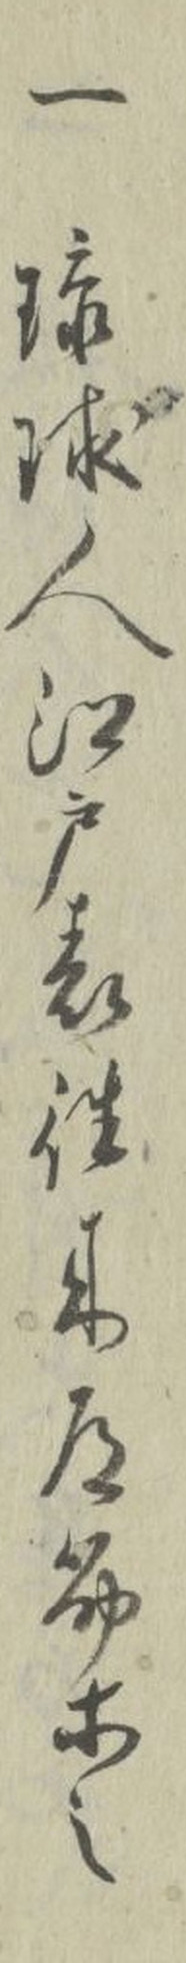一琉球人江戸表往来道筋等之
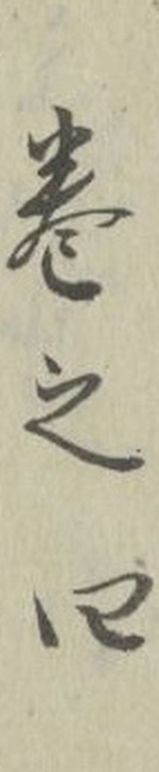巻之四
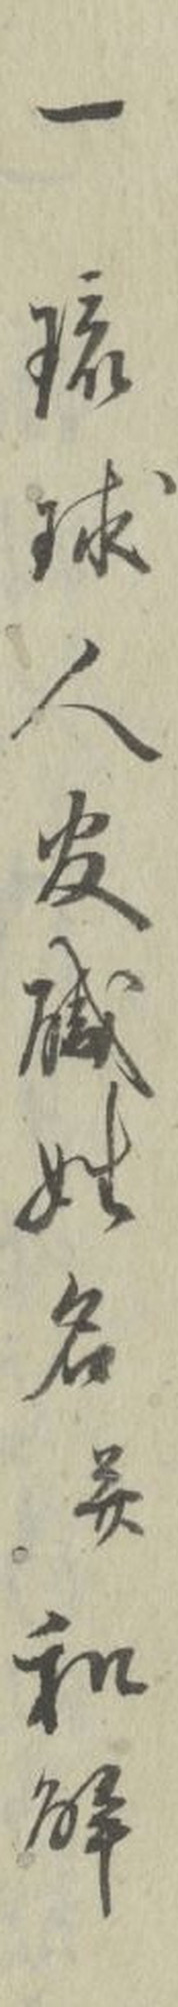一琉球人官職姓名幷和解
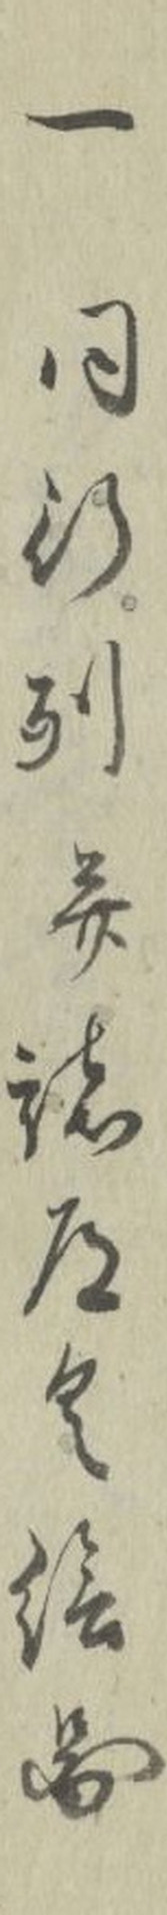一同行列幷諸道具絵図

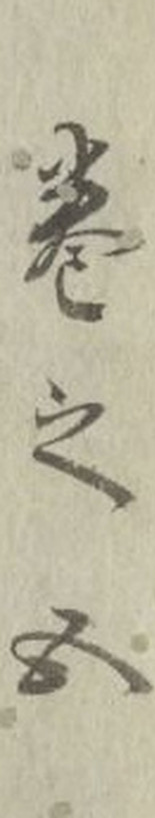巻之五
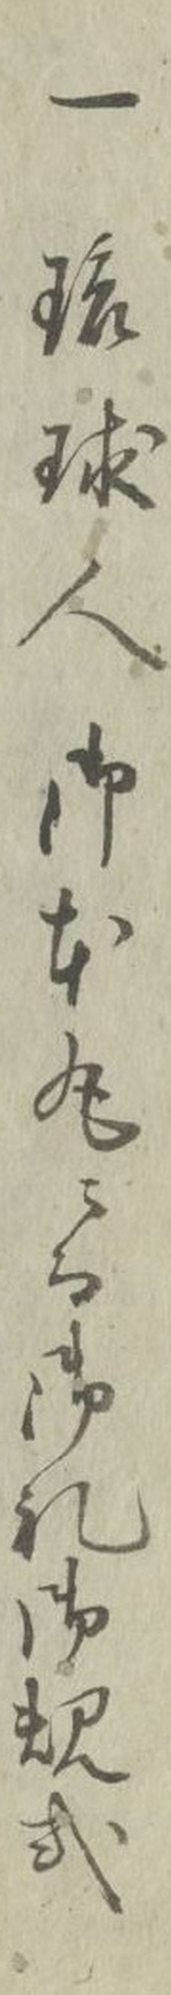一琉球人御本丸に而御礼規式
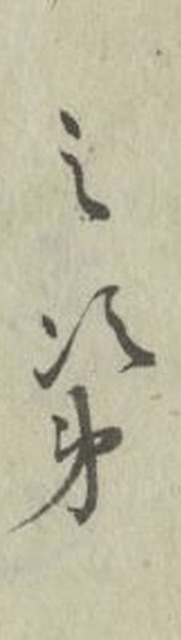之次第
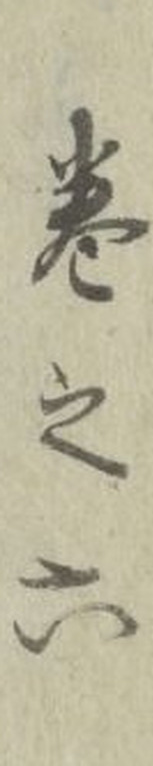巻之六
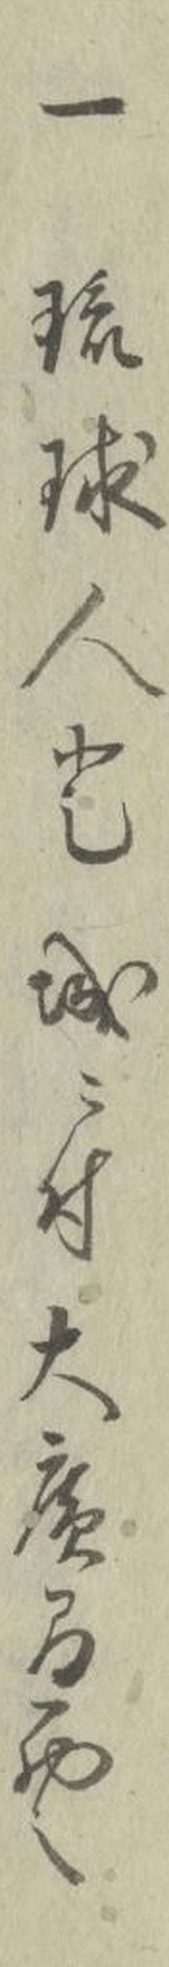一琉球人登城に付大広間西之
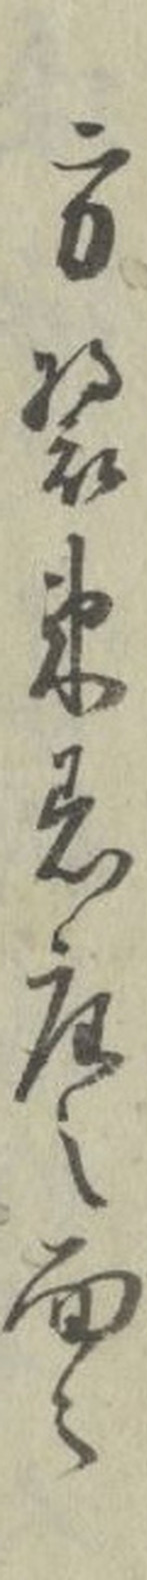方装束着座之面々
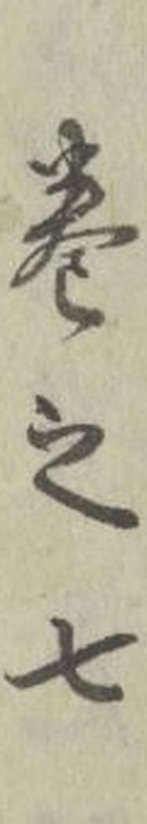巻之七
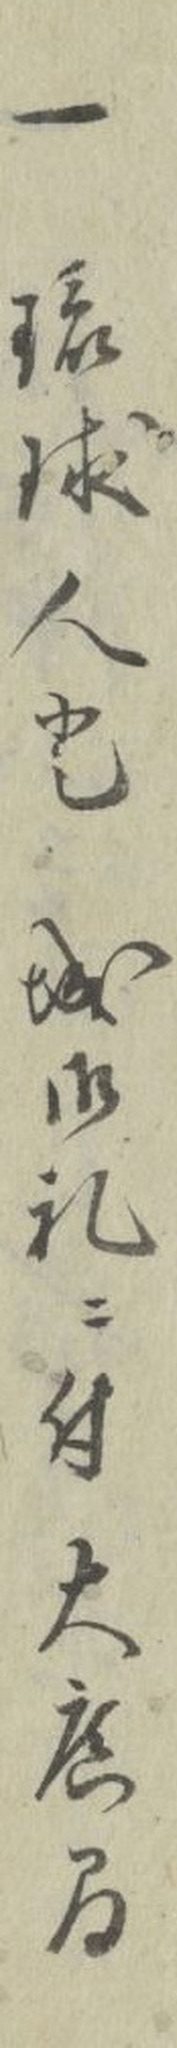一琉球人登城御礼に付大広間
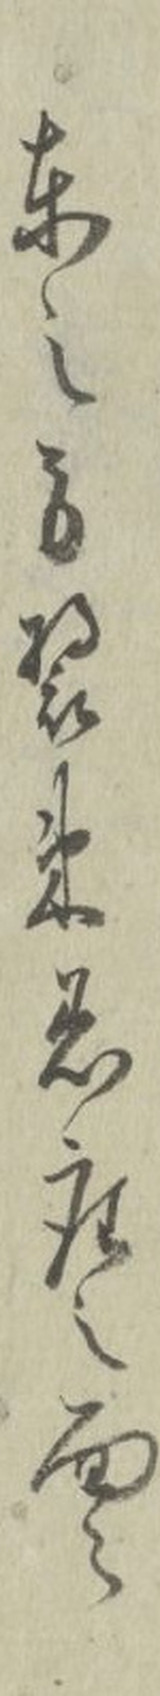東之方装束着座之面々
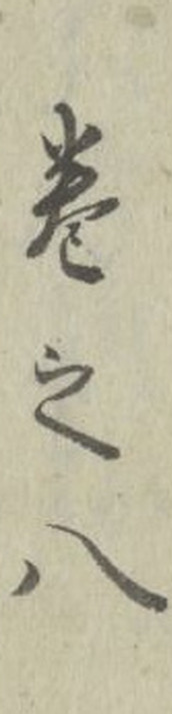巻之八
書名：琉球来朝記 自一至七
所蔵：University of the Ryukyus Library
